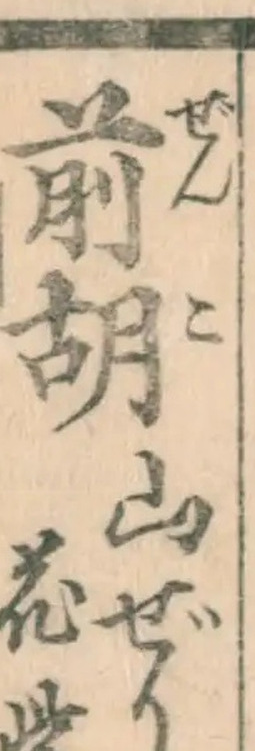前胡山ぜり
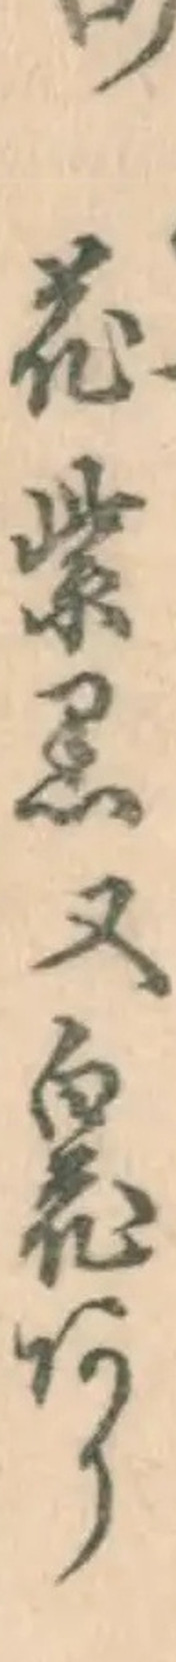花紫黒又白花あり
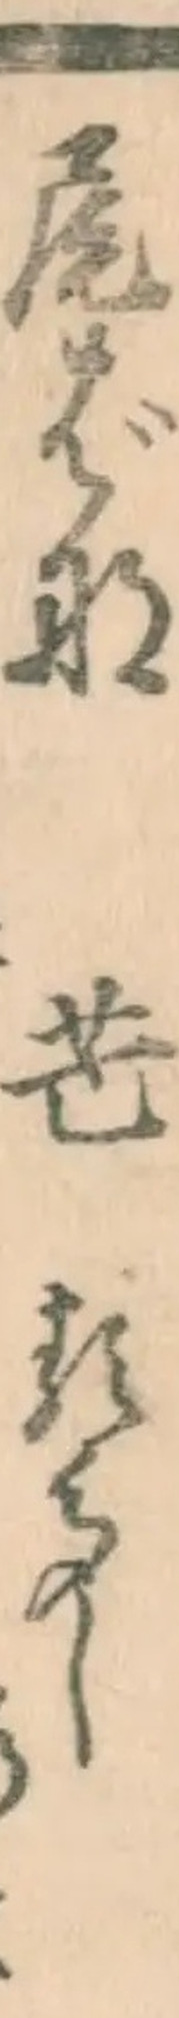尾ばな芒類多し
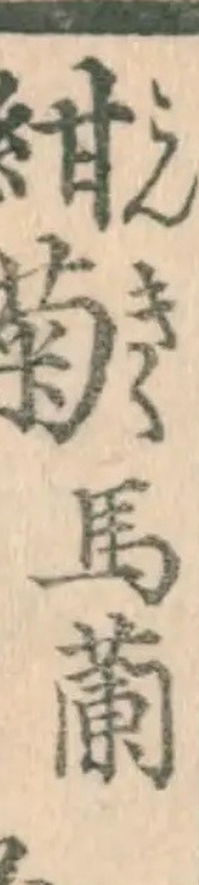紺菊馬蘭
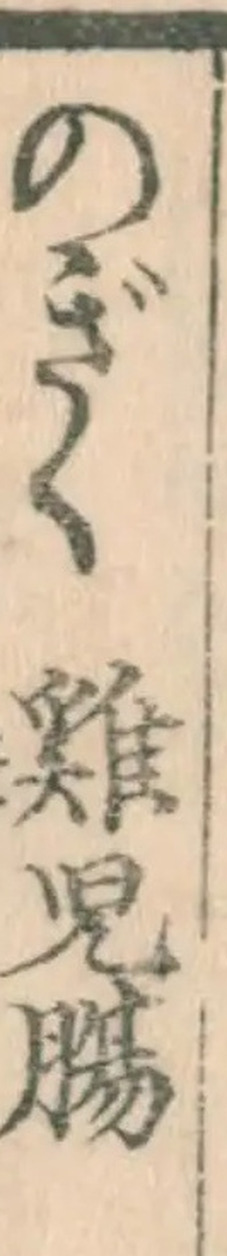のぎく鶏児
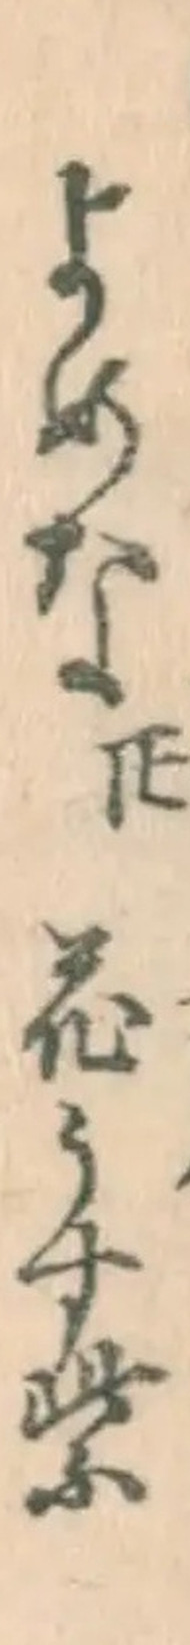よめなとも花うす紫
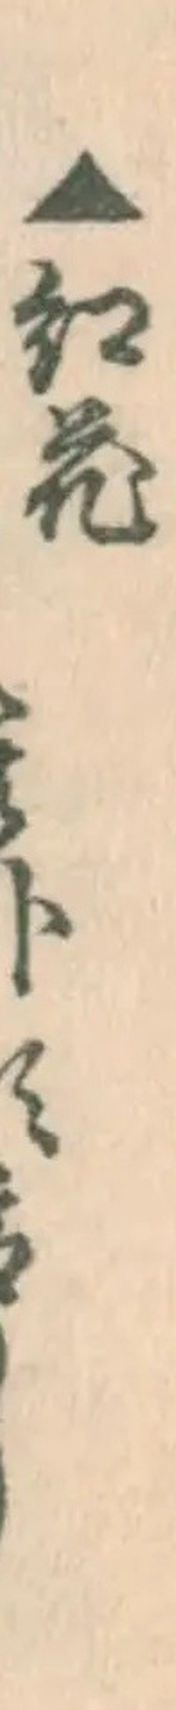▲紅花其外類多し
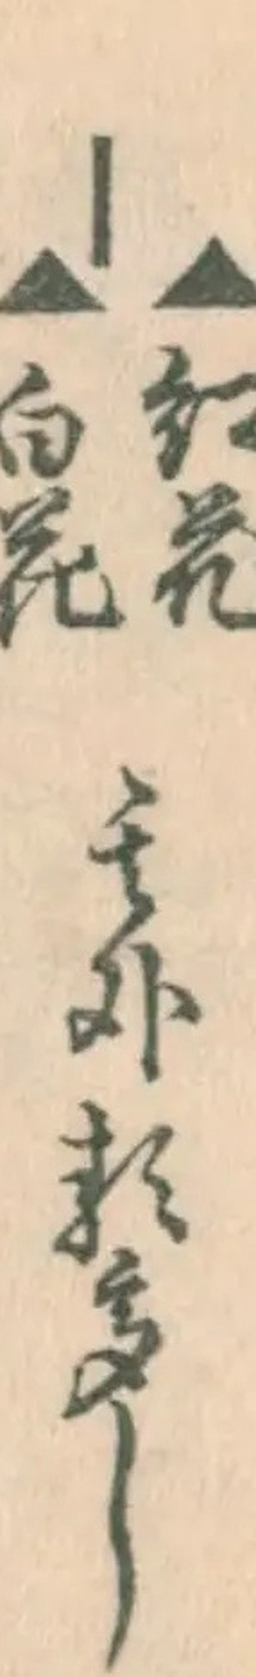▲紅花其外類多し
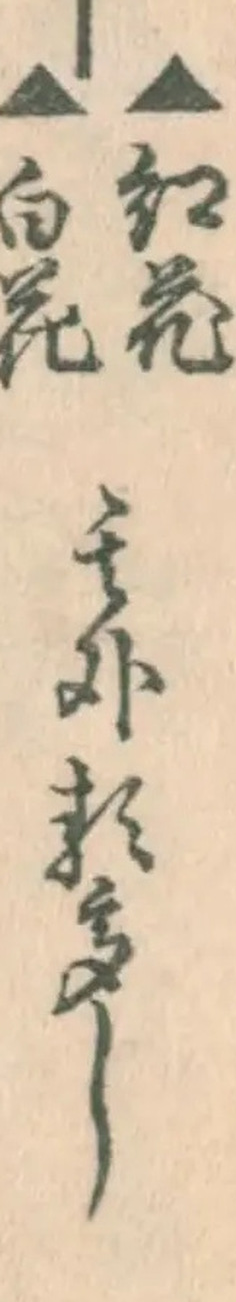▲紅花其外類多し
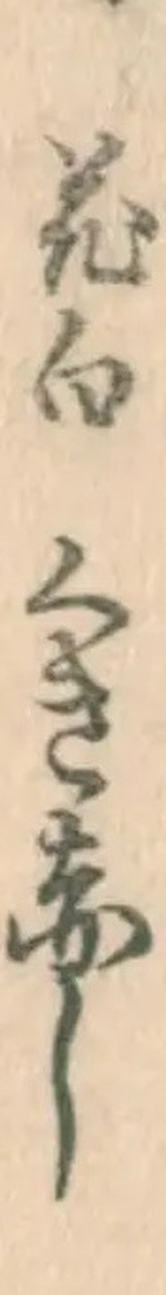花白くき赤し
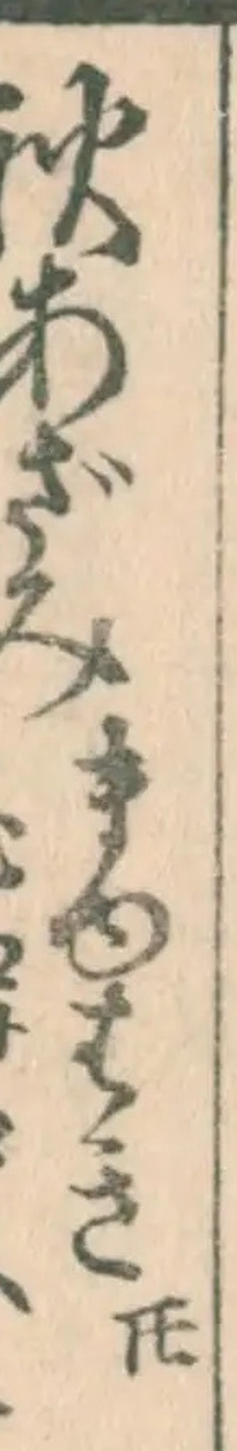秋あざみまゆはき共
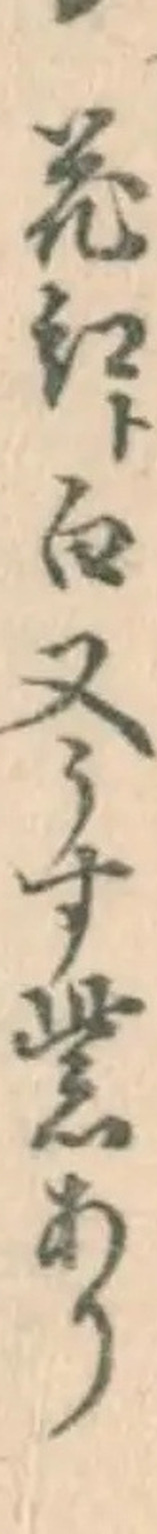花紅ト白又はうす紫あり
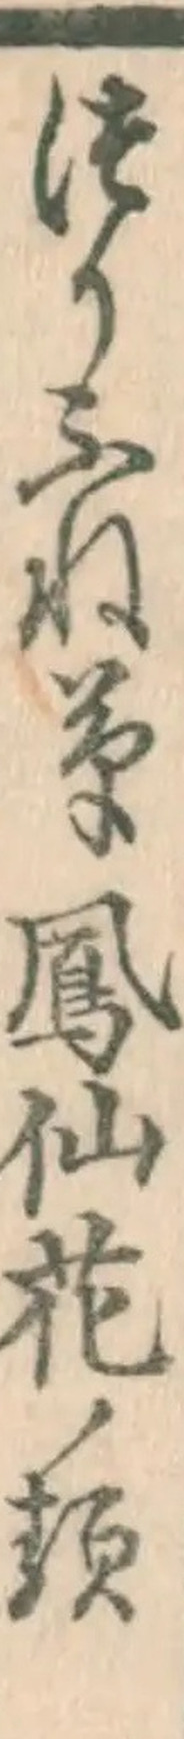つりふね草鳳仙花ノ類
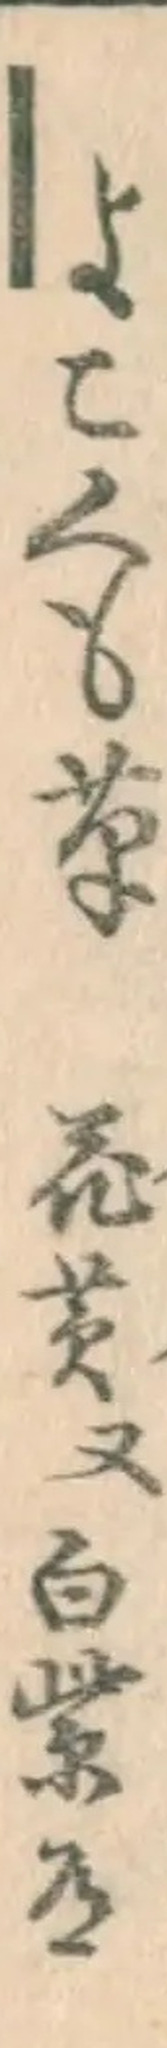よこくも草花黄又白紫有
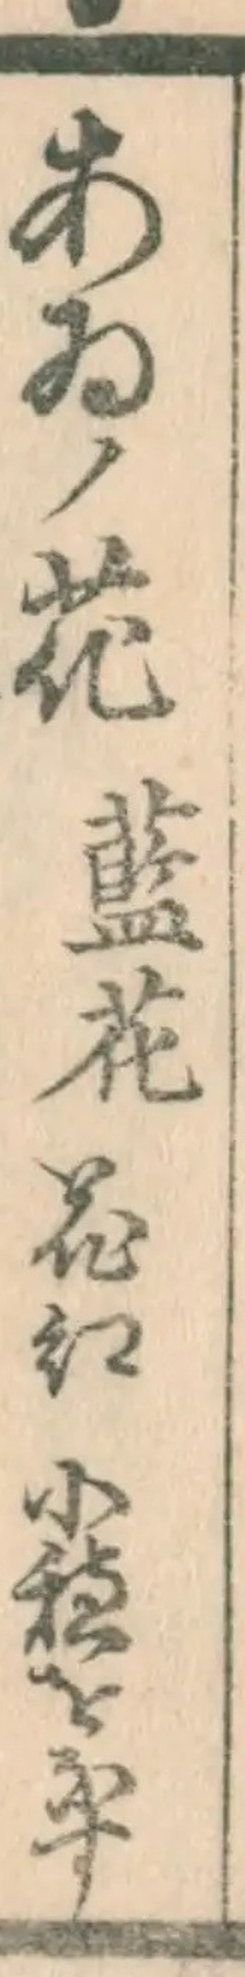あゐノ花藍花花紅小穂を出す
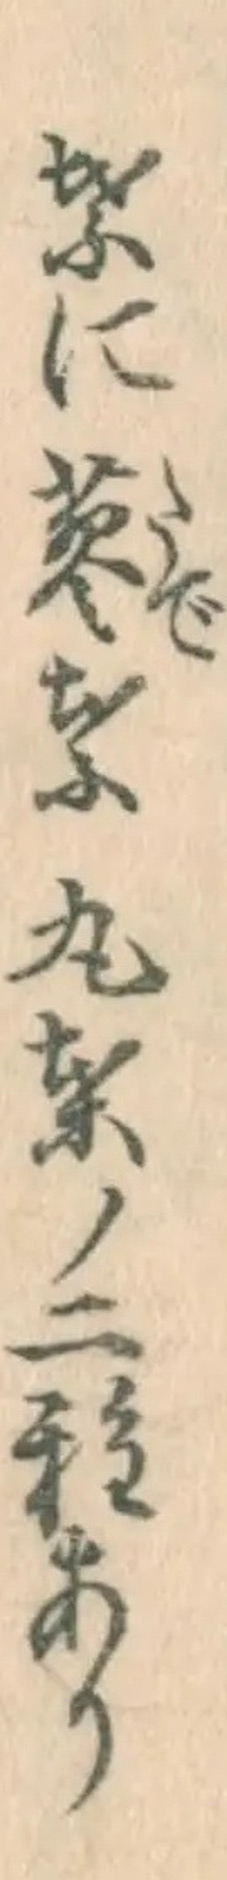葉に蓼葉丸葉ノ二種あり
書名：茶席挿花集
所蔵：国立国会図書館 National Diet Library, JAPAN
